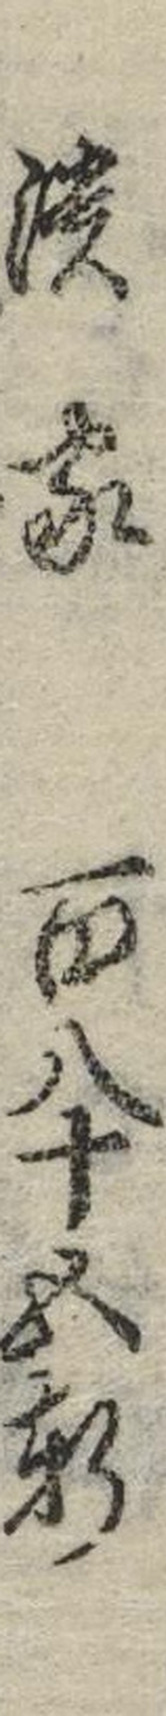潰家百八十五軒
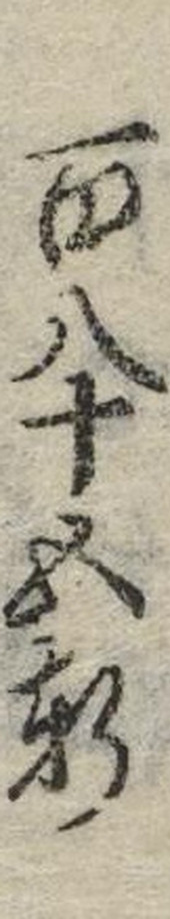潰家百八十五軒
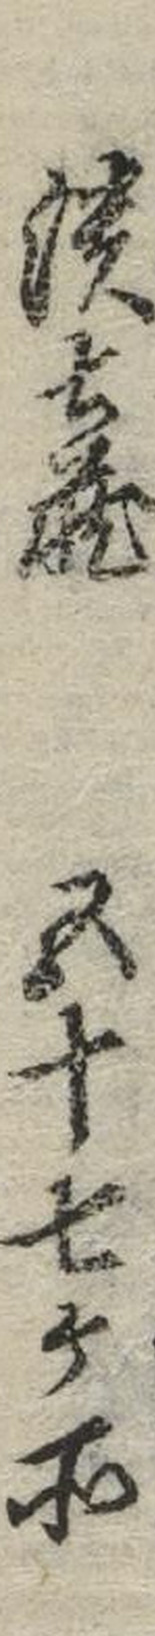潰土蔵五十七ケ所
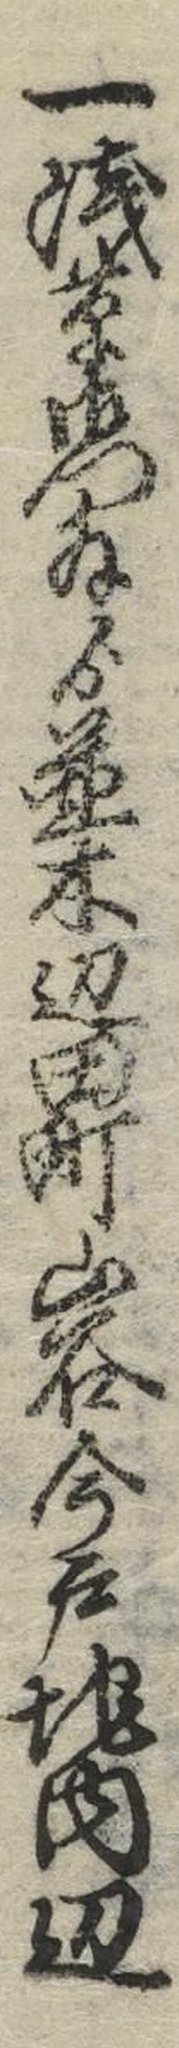一浅草御門外ゟ並木辺田町山谷今戸地内辺
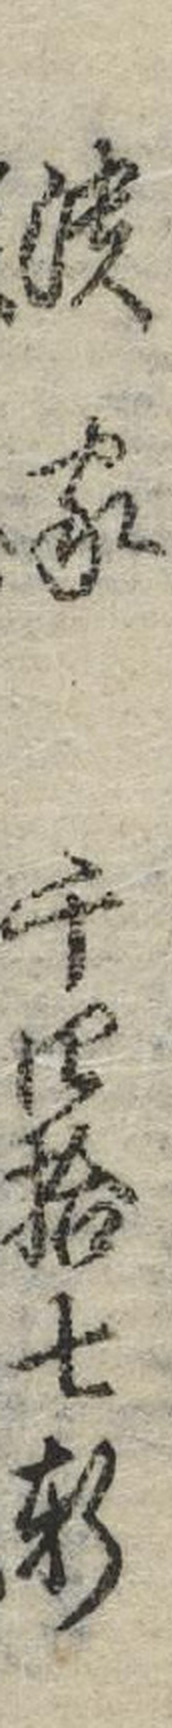潰家千四拾七軒
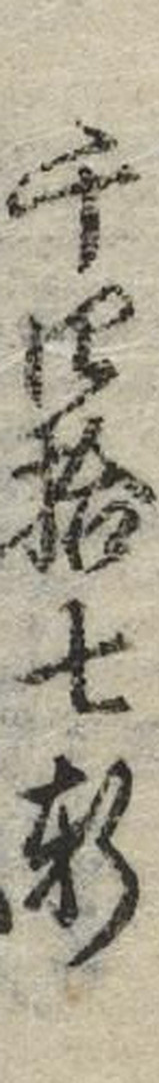潰家千四拾七軒
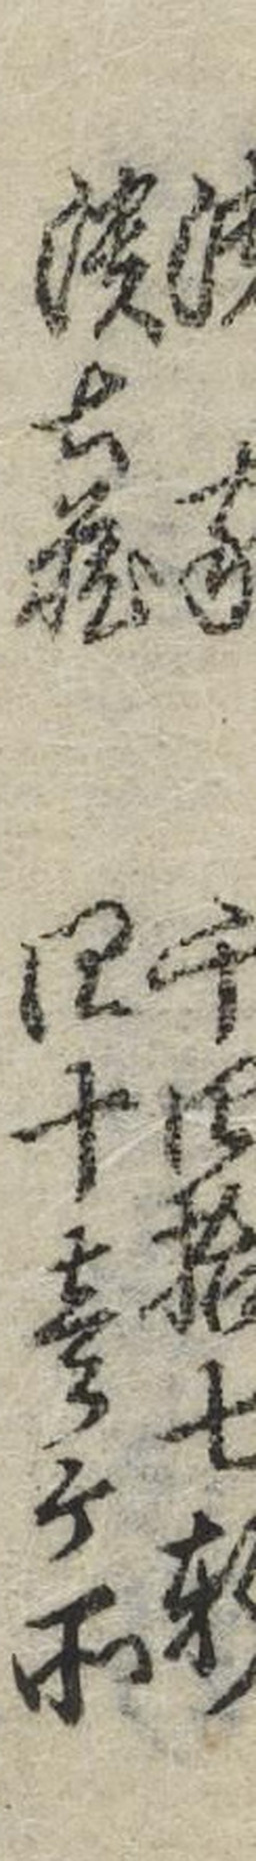潰土蔵四十壱ケ所
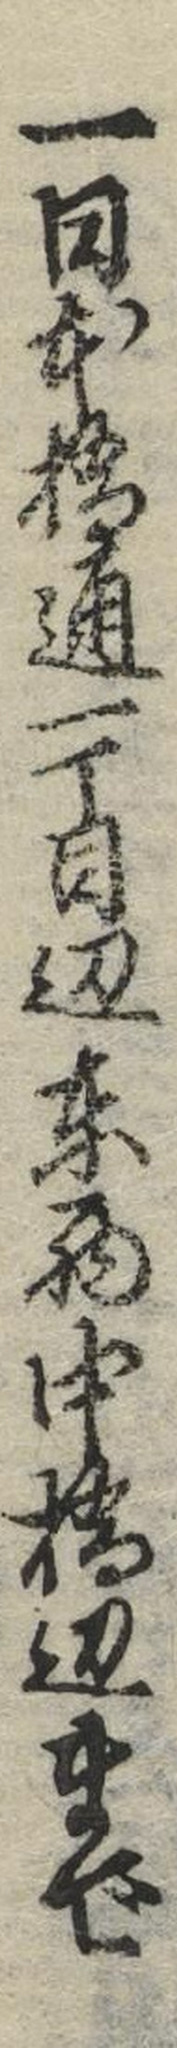一日本橋通一丁目辺東西中橋辺まで
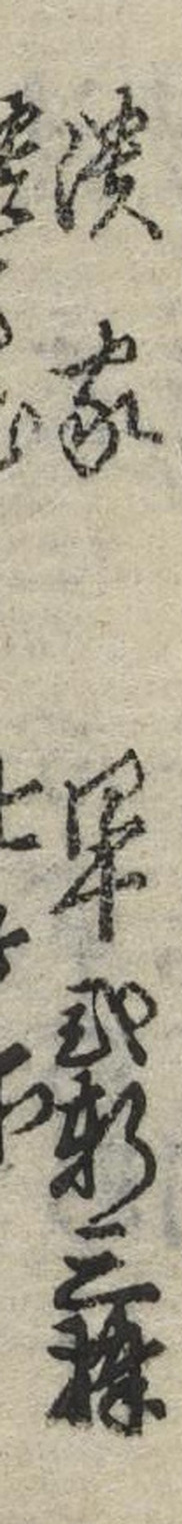潰家四十弐軒三棟
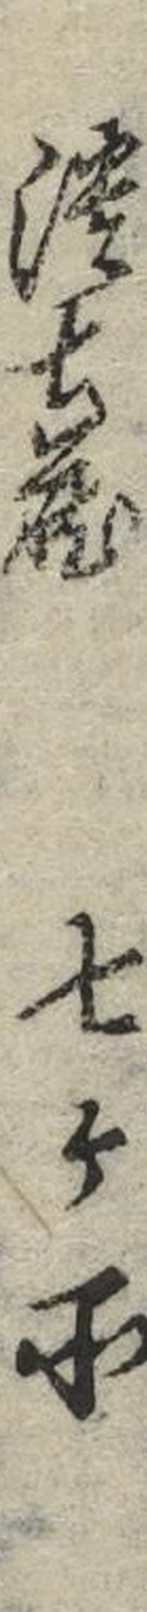潰土蔵七ケ所
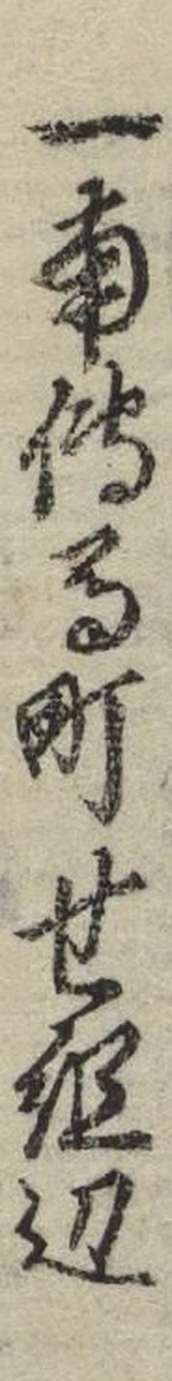一南傳馬町せ組辺
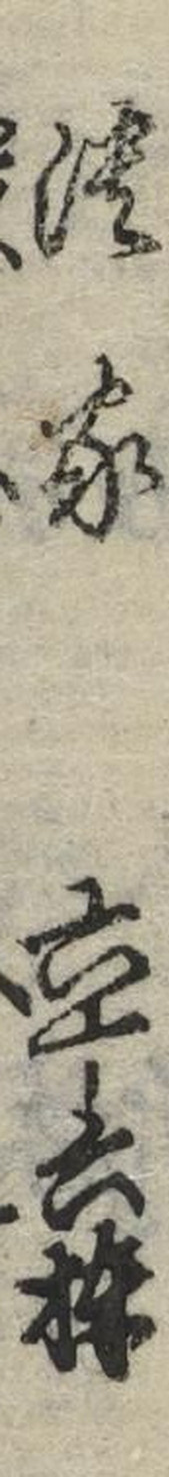潰家六十六棟
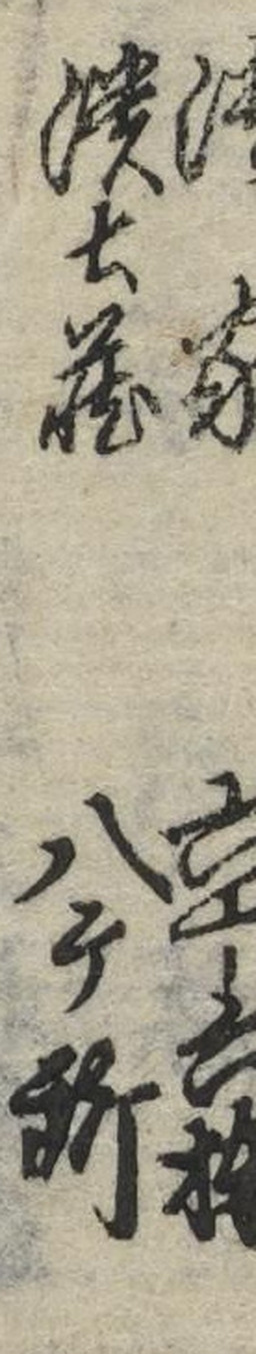潰土蔵八ケ所

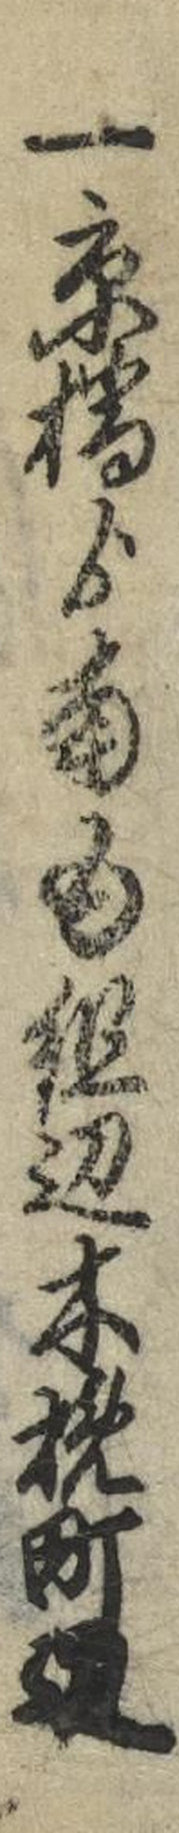一京橋ゟ南も組辺木挽町辺
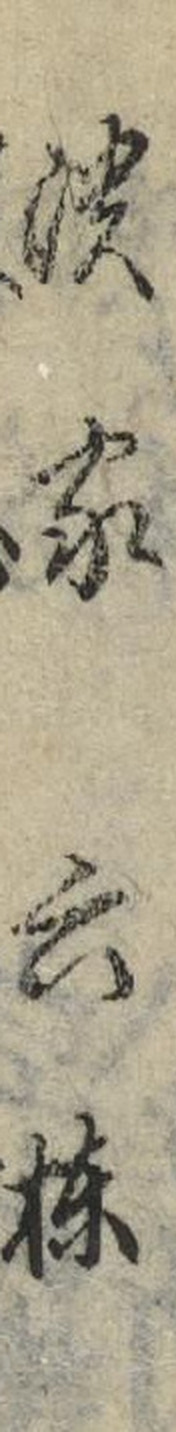潰家六棟
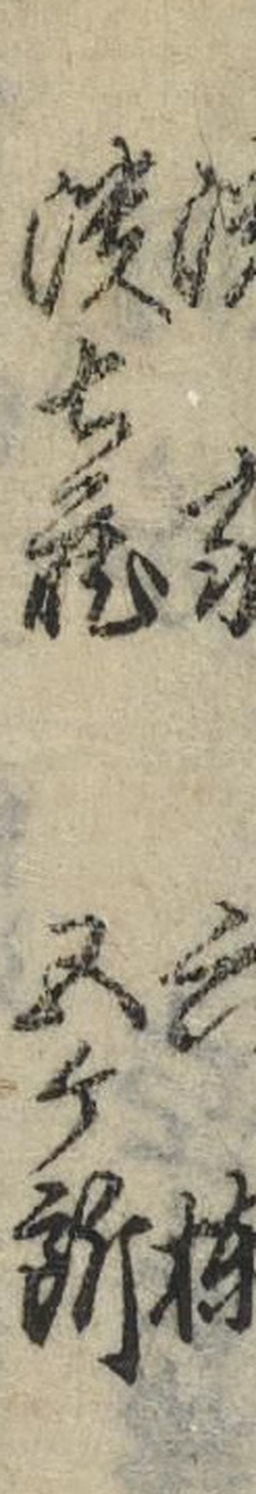潰土蔵五ケ所
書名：江戸御屋鋪方町方共　地震類焼場所巨細書之寫　潰家潰土蔵共取調附街道筋近在迄
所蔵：東京大学地震研究所図書室 Earthquake Research Institute Library, The University of Tokyo, JAPAN
